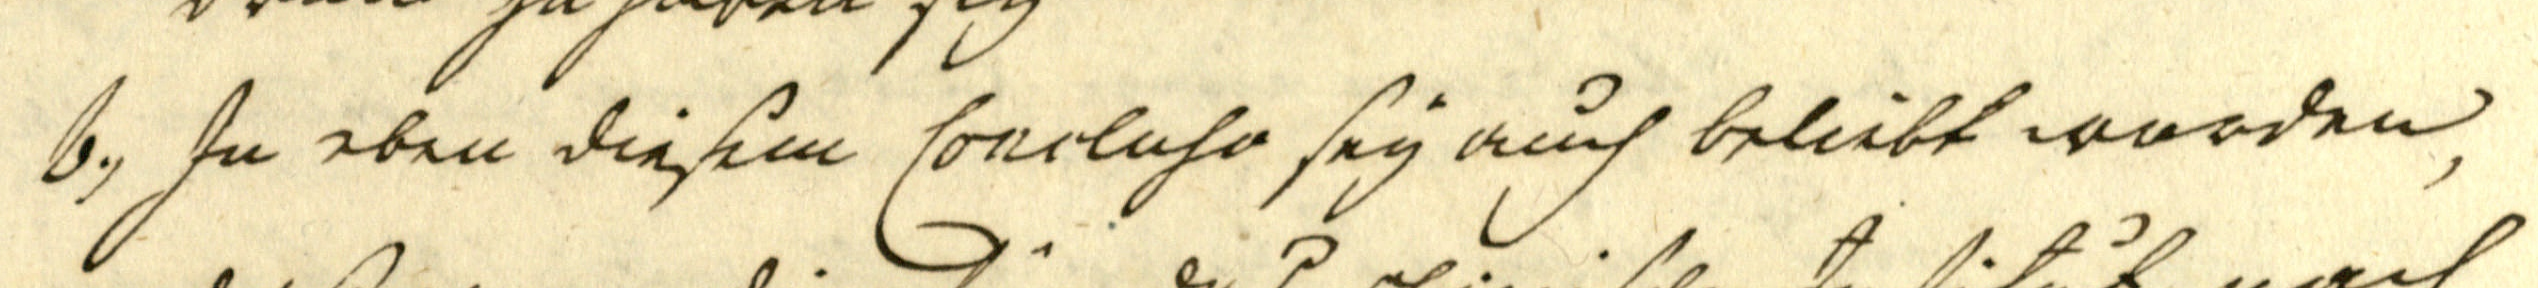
b., In eben diesem Concluso seÿ auch beliebt worden,
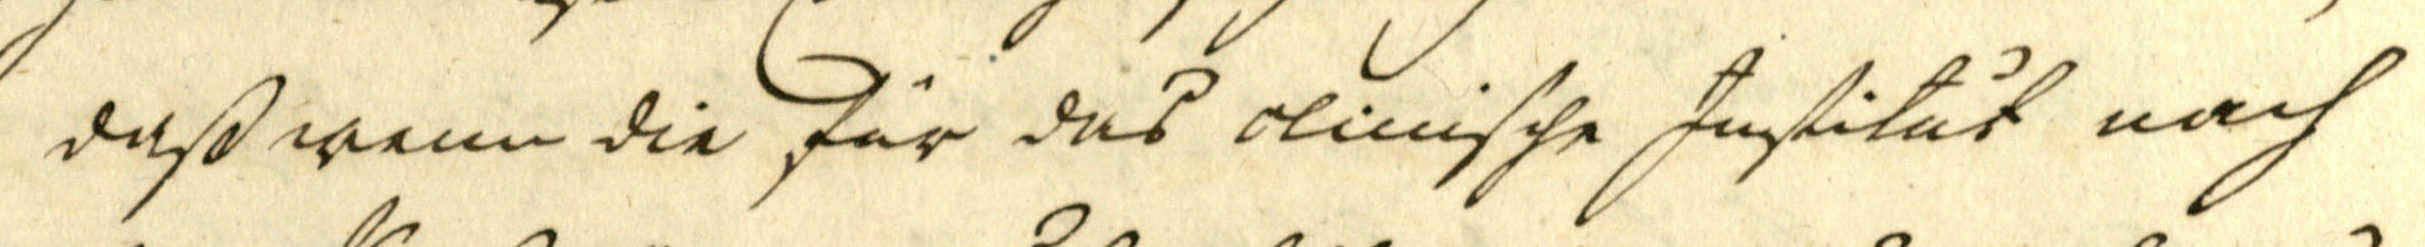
daß wenn die für das clinische Institut nach
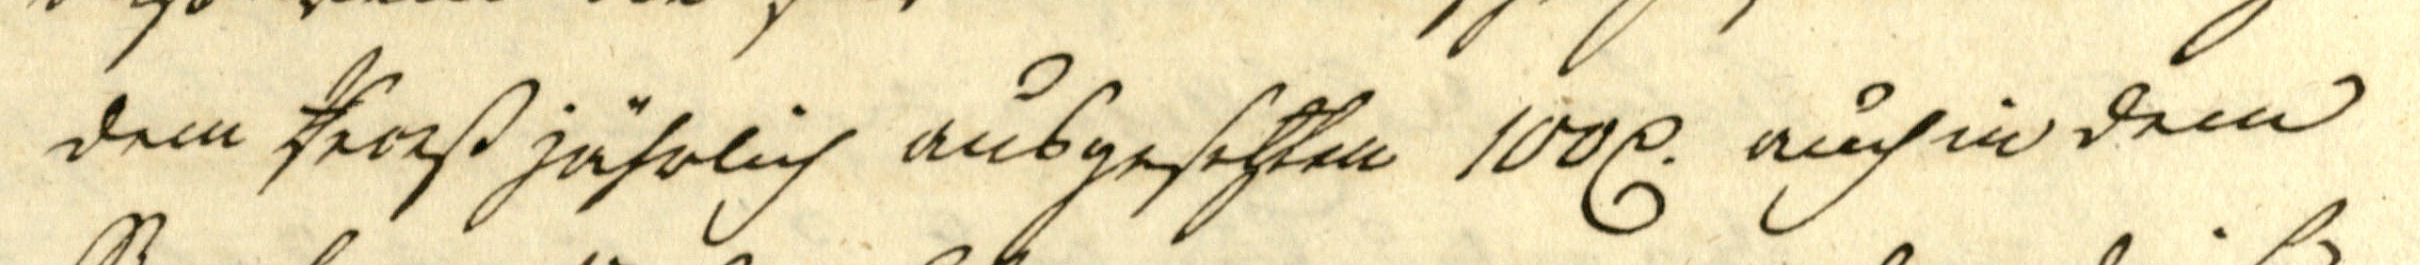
dem Receß jährlich ausgesetzten 100 l. auch in dem
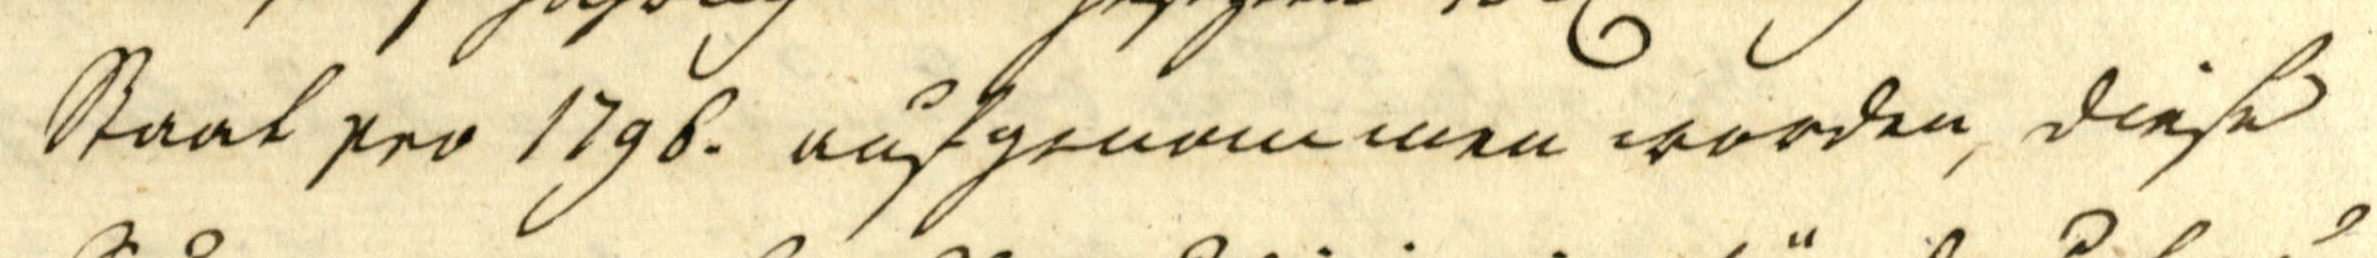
Staat pro 1796. aufgenommen worden, diese
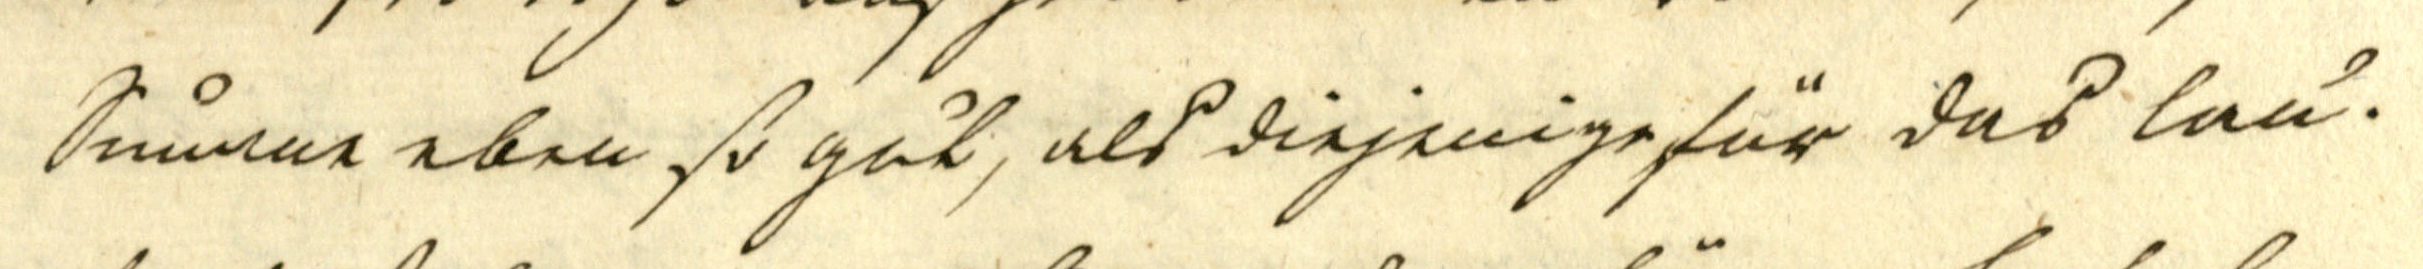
Summe eben so gut, als diejenige für das lau¬
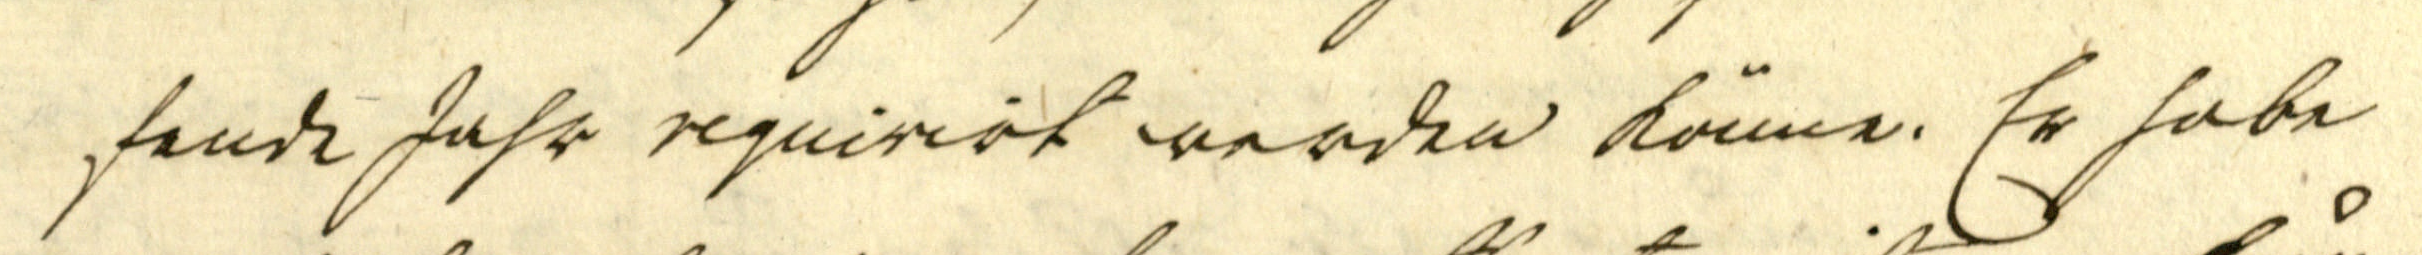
fende Jahr requirirt werden könne. Er habe
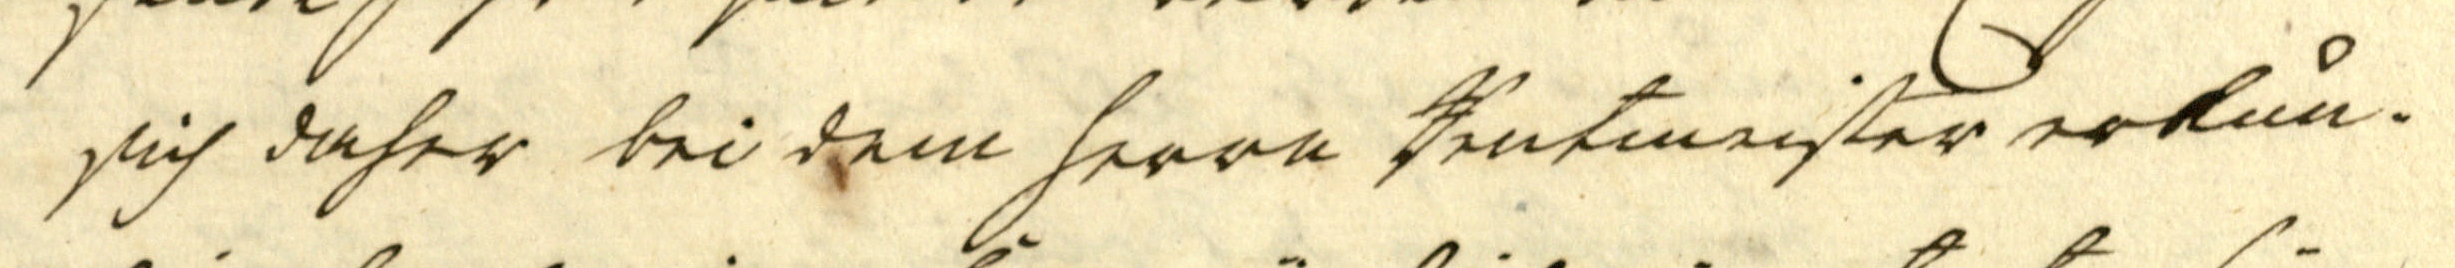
sich daher bei dem Herrn Rentmeister erkun¬
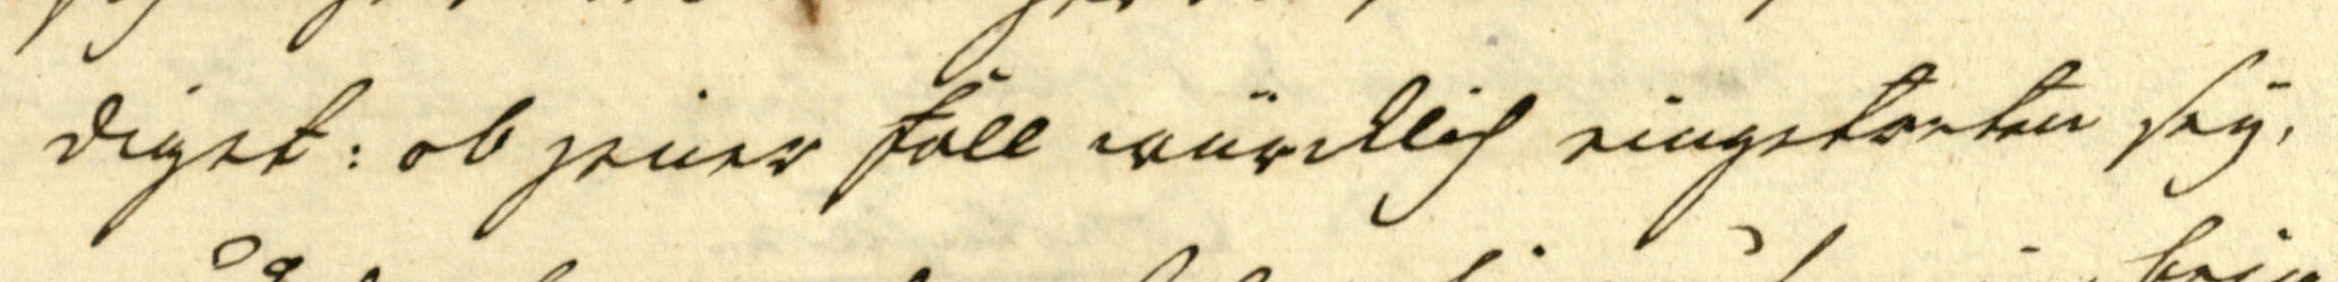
diget: ob jener Fall würcklich eingetreten seÿ,
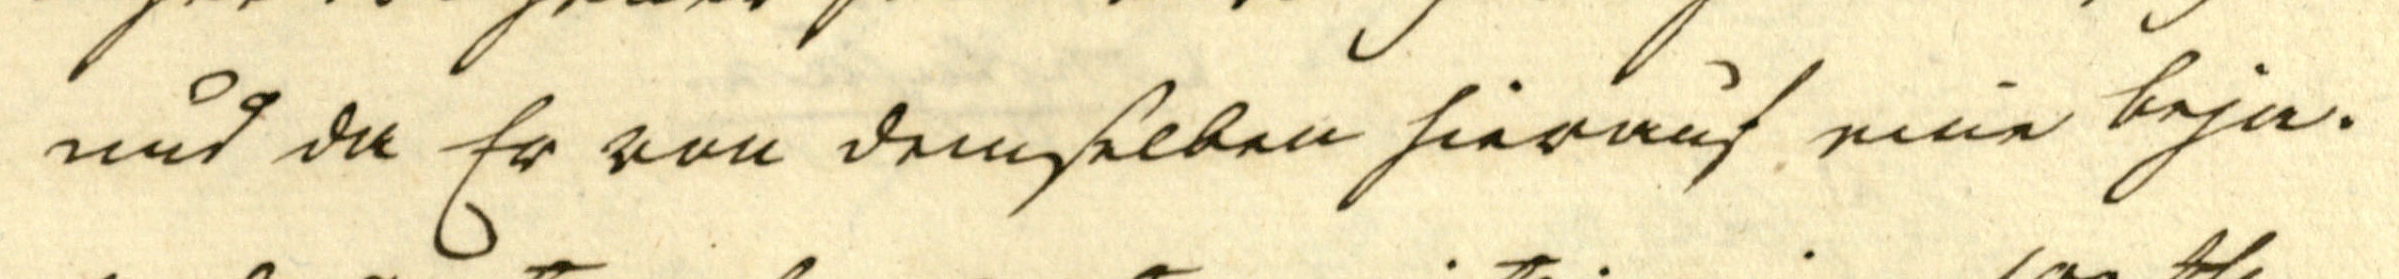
und da Er von demselben hierauf eine beja¬
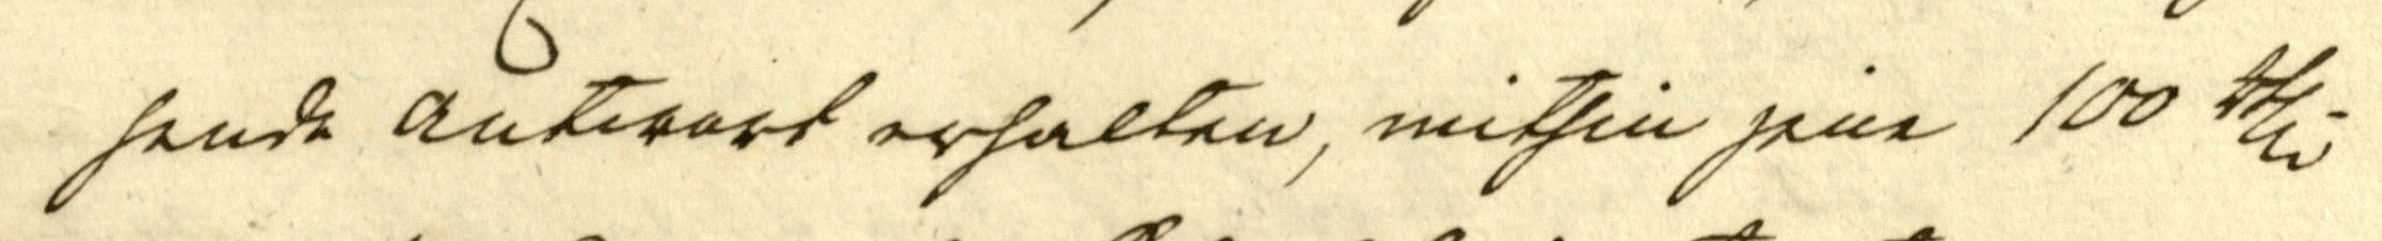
hende Antwort erhalten, mithin jene 100 rtl.
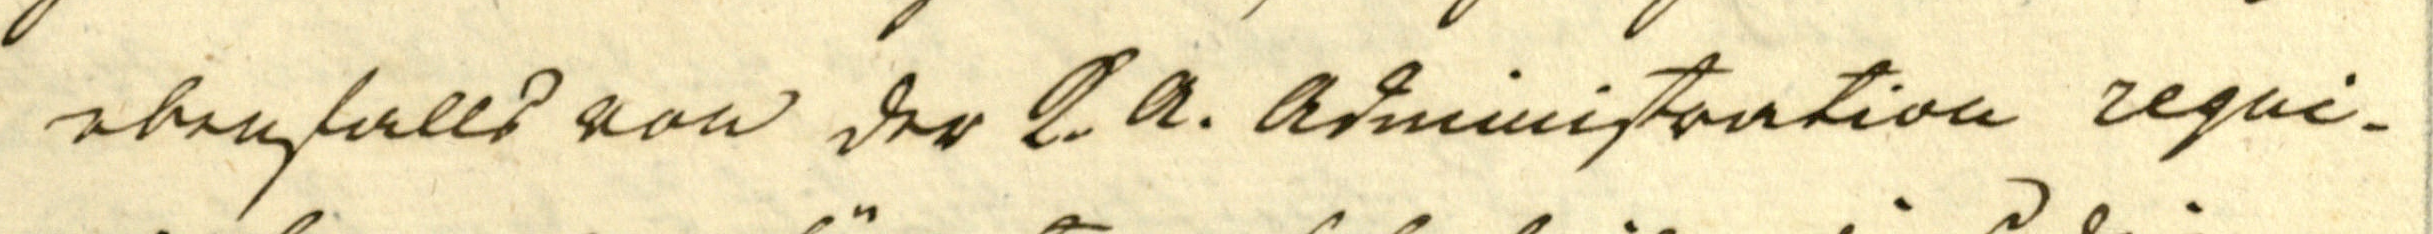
ebenfalls von der K. A. Administration requi¬
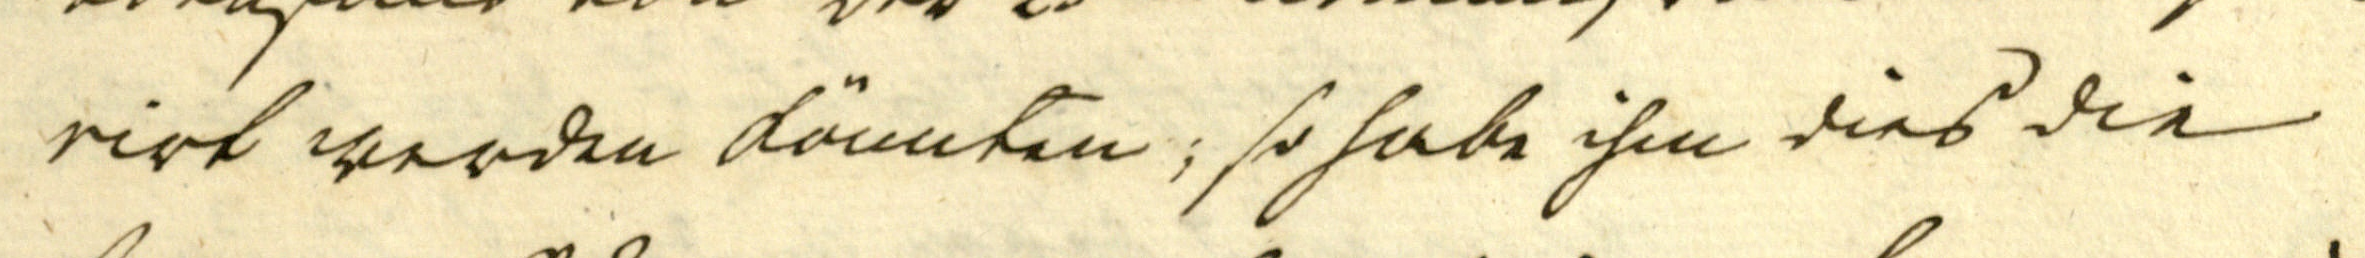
rirt werden könnten, so habe ihm dies die
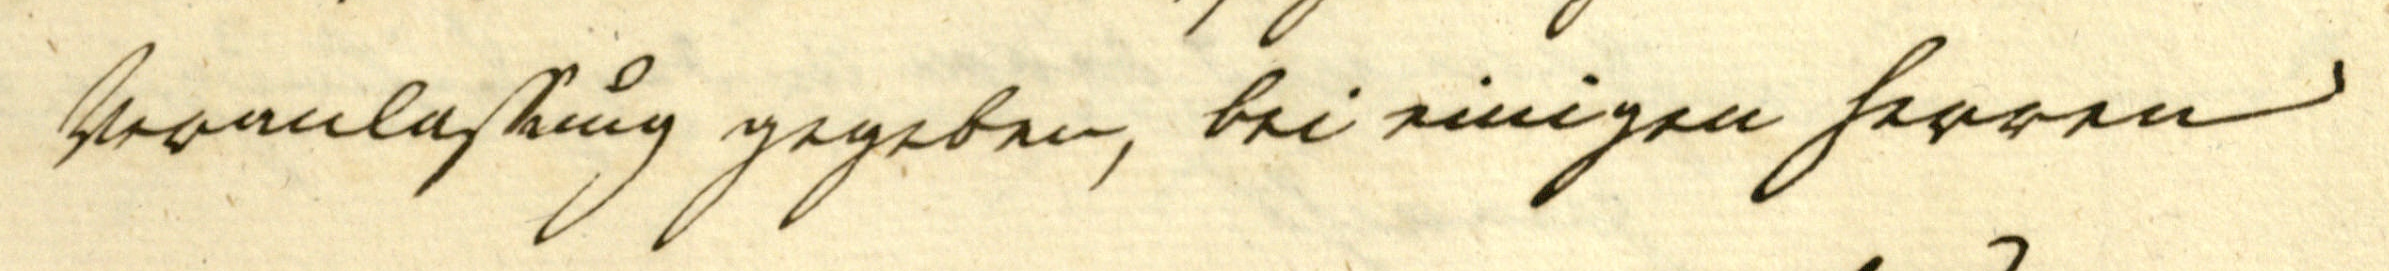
Veranlassung gegeben, bei einigen Herren
